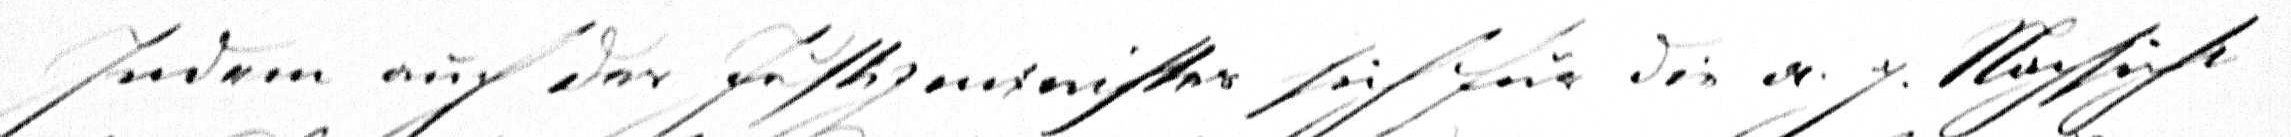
Indem auch der Justizminister sich für die a.g. Nachsicht
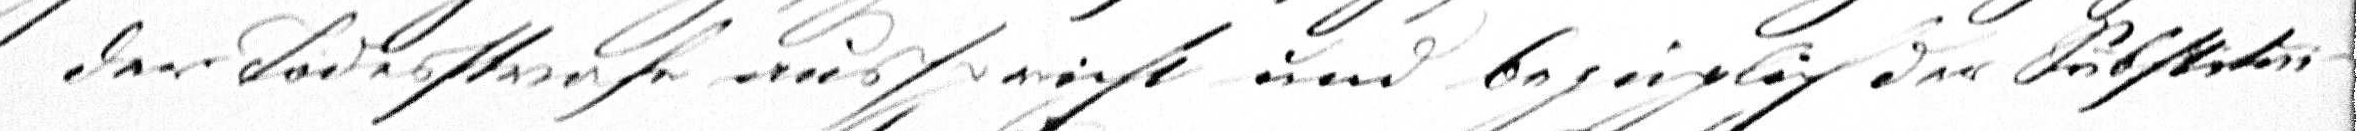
der Todesstrafe ausspricht und bezüglich der Substitui¬
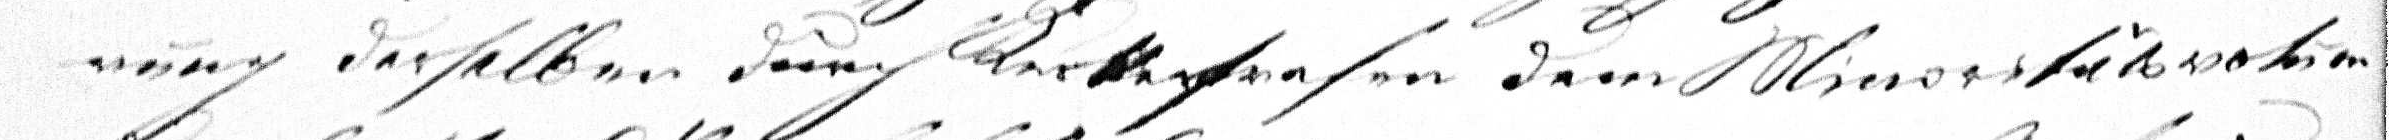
rung derselben durch Kerkerstrafen dem Minoritätsvotum
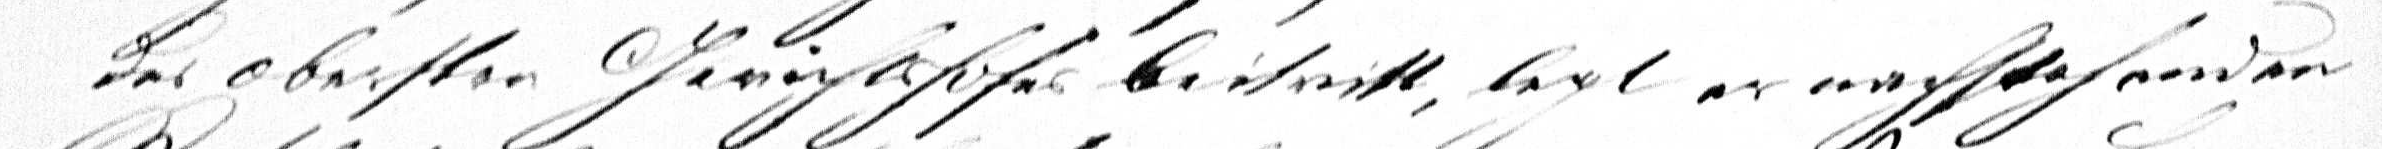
der obersten Gerichtshofes beitritt, legt er nachstehenden
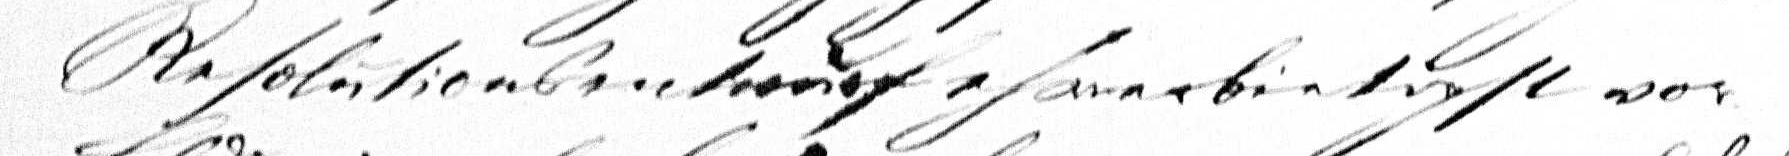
Resolutionsantrag ehrerbietigst vor.
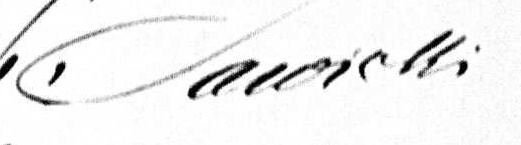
Sawicki
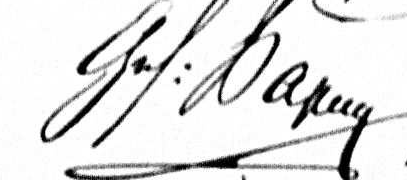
Ges. Basny
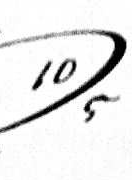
10/5
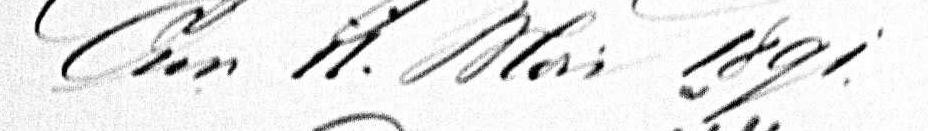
Am 11. Mai 1891
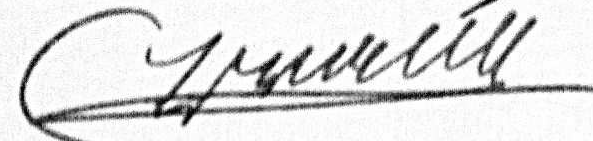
Wraun
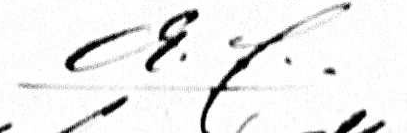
AE
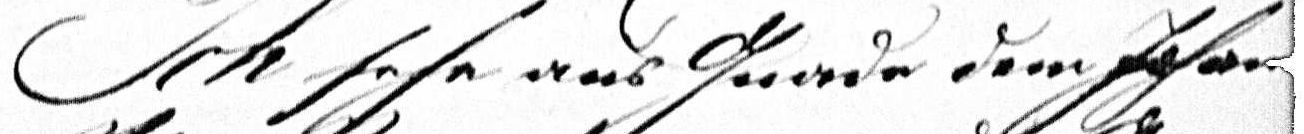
Ich sehe aus Gnade dem Johann
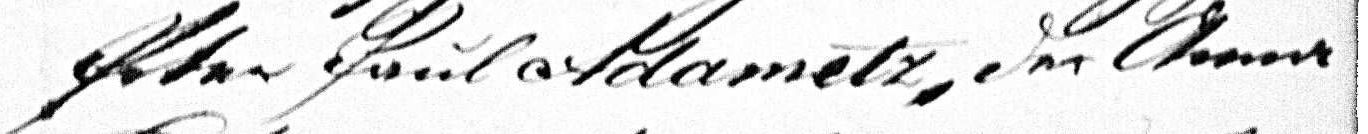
Peter Paul Adametz, der Anna
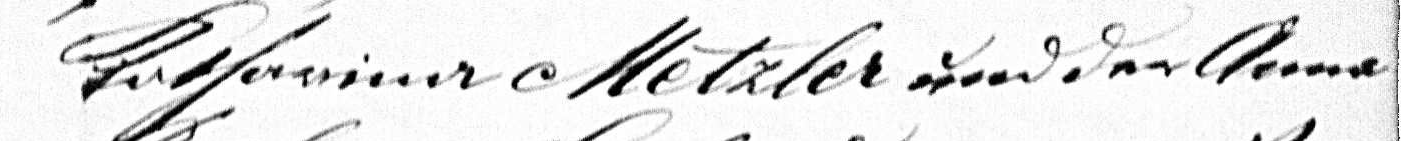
Katharina Metzler und der Anna
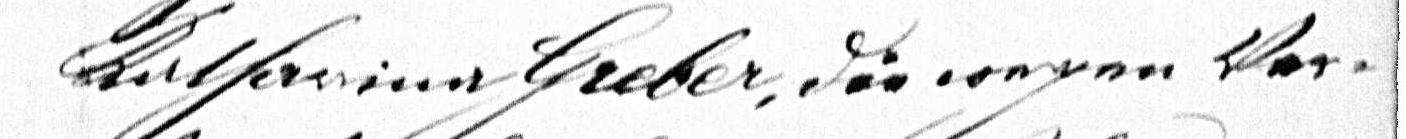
Katharina Greber, die wegen Ver¬
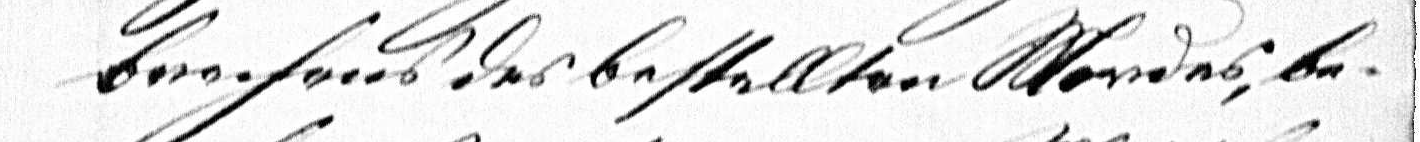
brechens des bestellten Mordes, be¬
